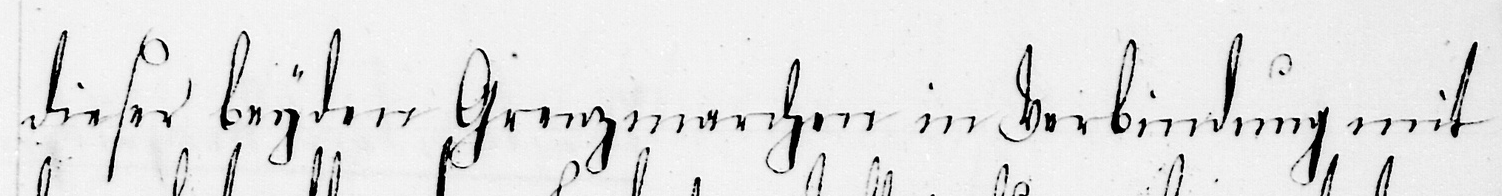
dieser beyden Grenzmarchen in Verbindung mit
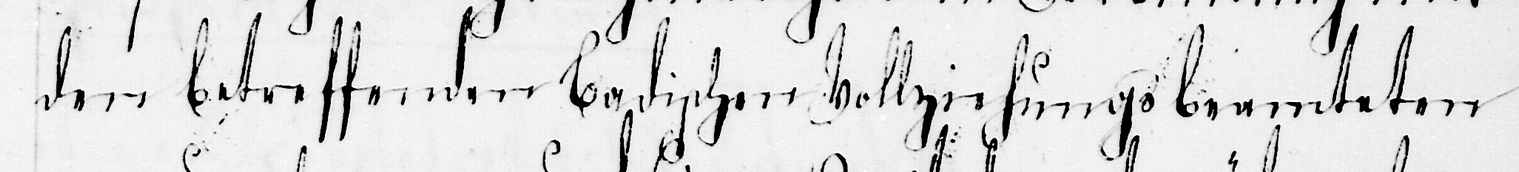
den betreffenden Badischen Vollziehungsbeamteten
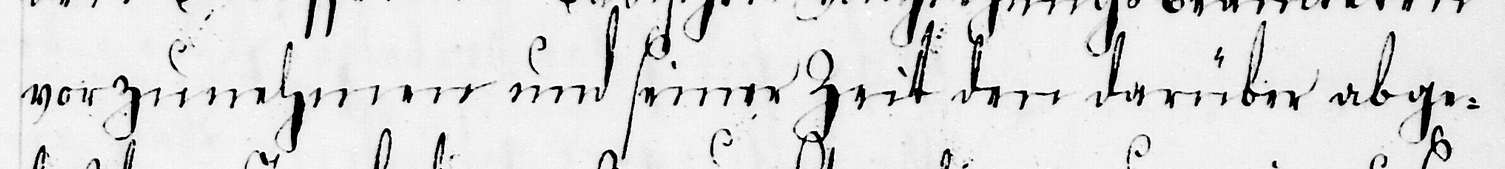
vorzunehmen und seiner Zeit den darüber abge¬
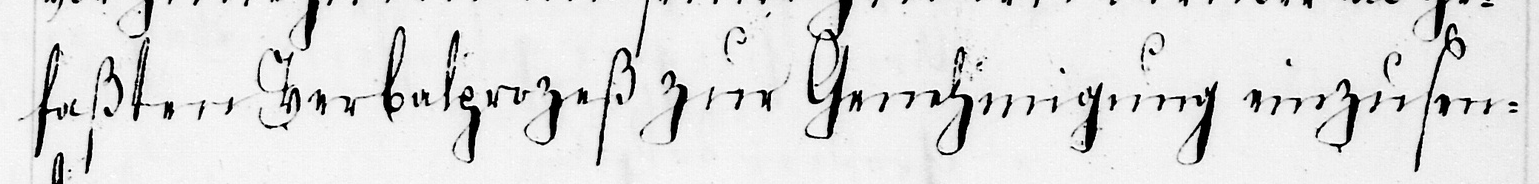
faßten Verbalprozeß zur Genehmigung einzusen¬
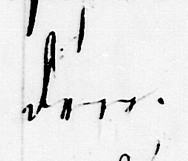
den.
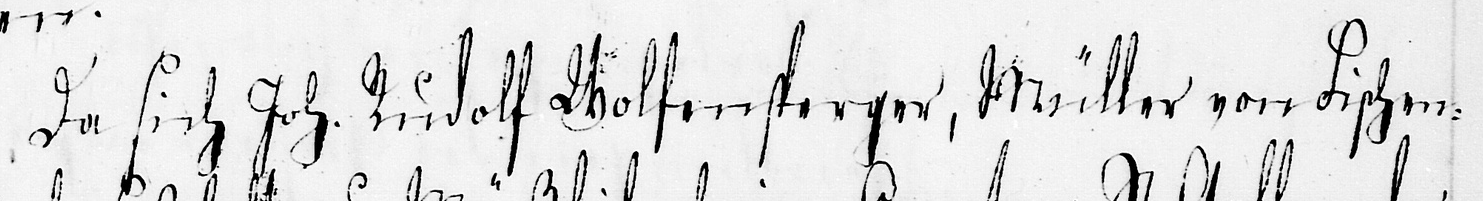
Da sich Joh. Rudolf Wolfensperger, Müller von Fischen¬
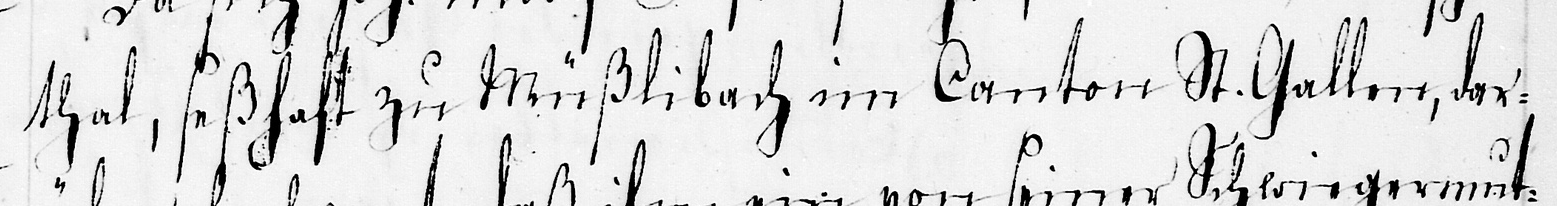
thal, seßhaft zu Müßlibach im Canton St. Gallen, dar¬
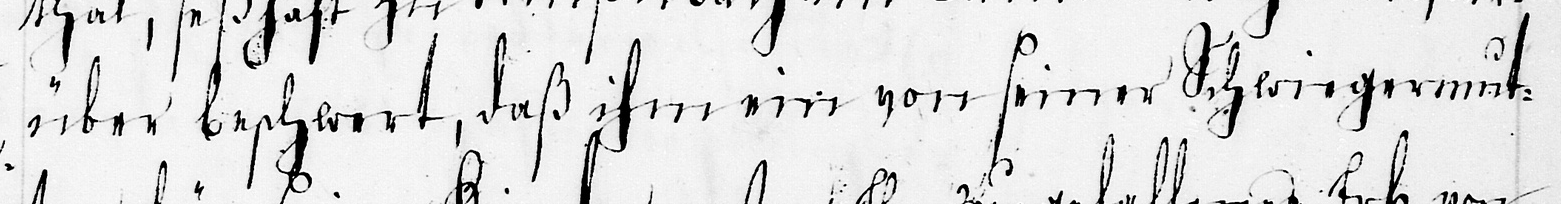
über beschwert, daß ihm ein von seiner Schwiegermut¬
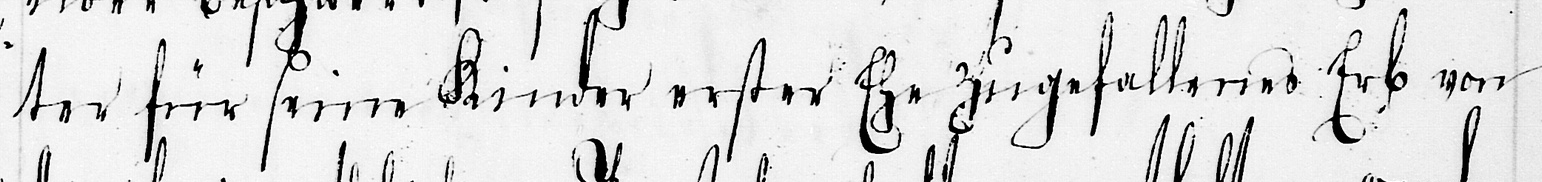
ter für seine Kinder erster Ehe zugefallenes Erb von
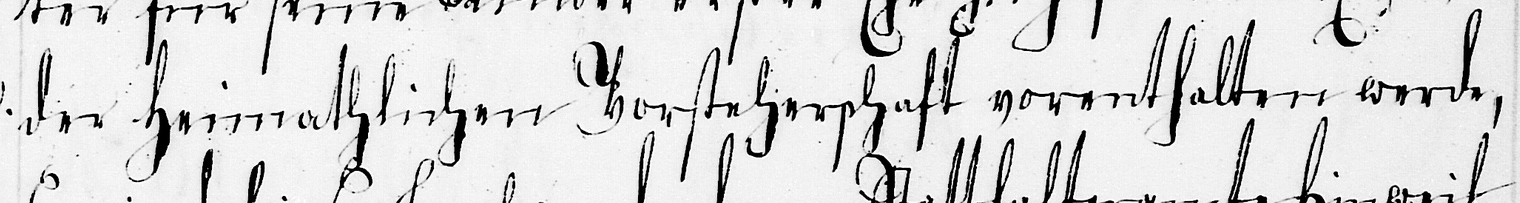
der Heimathlichen Vorsteherschaft vorenthalten werde,
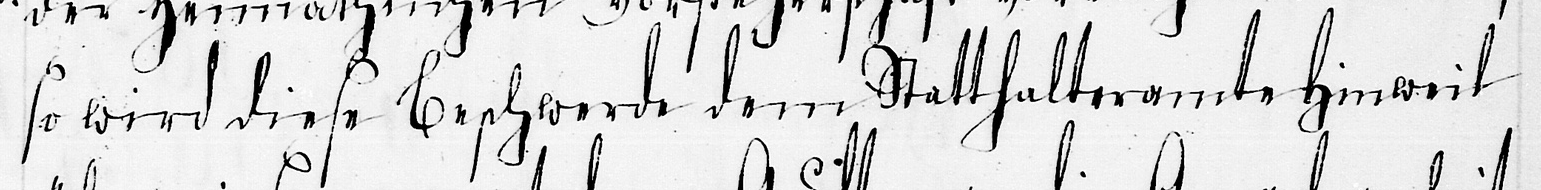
so wird diese Beschwerde dem Statthalteramte Hinweil
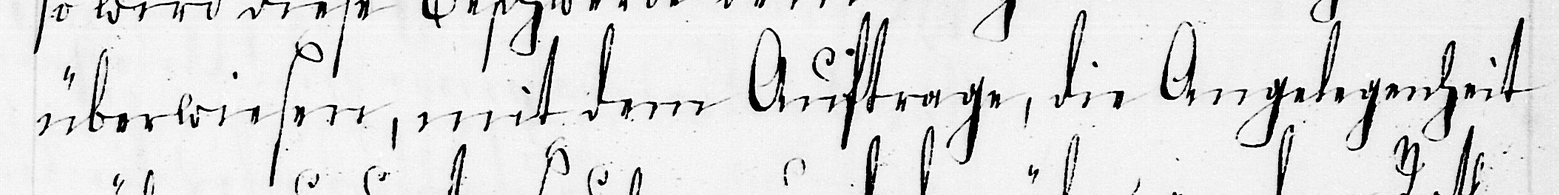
überwiesen, mit dem Auftrage, die Angelegenheit
